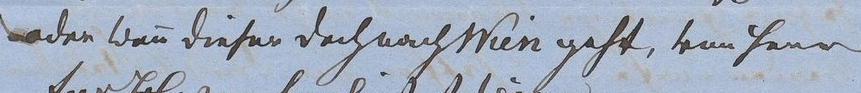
oder wenn dieser doch nach Wien geht, von Herr
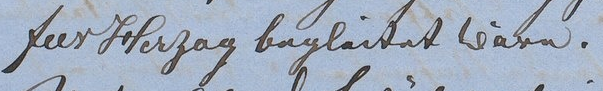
Feer Herzog begleitet wäre.
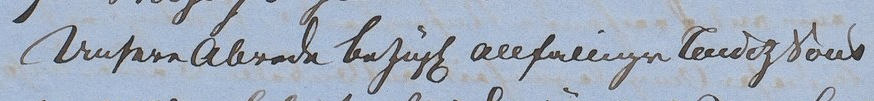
Unsere Abrede bezügl allfälliges Rendezvous
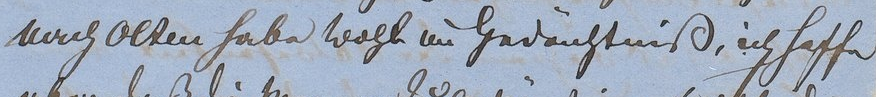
nach Olten habe wohl im Gedächtniß, ich hoffe
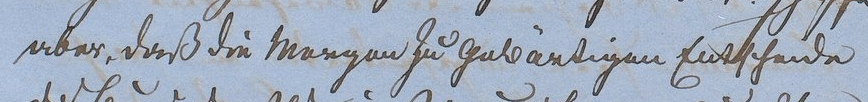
aber, daß die Morgen Zu gewärtigen Entscheide
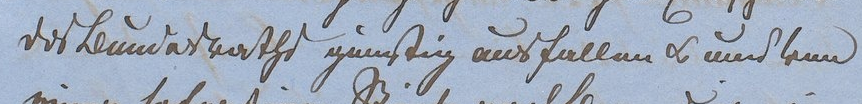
des Bundesraths günstig ausfallen & uns von
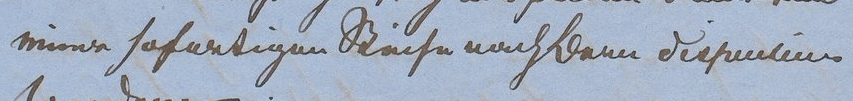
einer sofortigen Reise nach Bern dispensiren
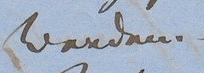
werden. –
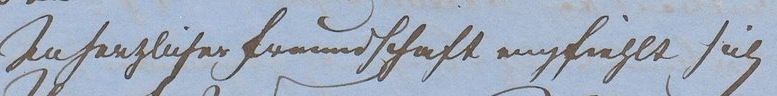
In herzlicher Freundschaft empfiehlt sich
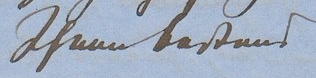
Ihnen bestens
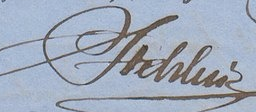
Stehlin
